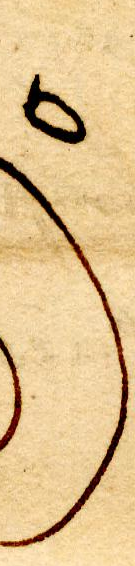To
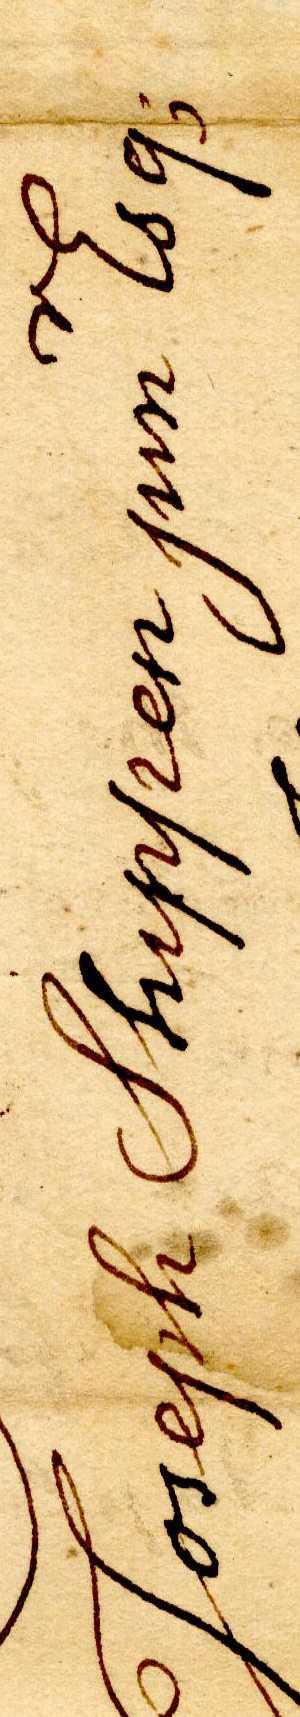Joseph Shippen jun^r Esq;
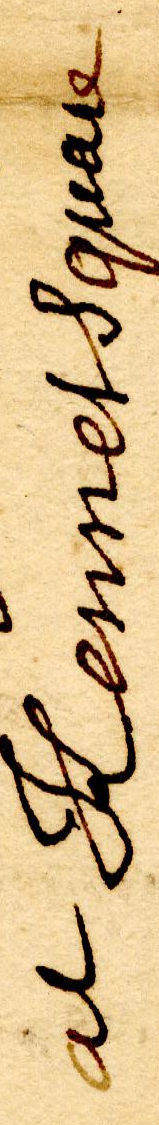at Kennet Square
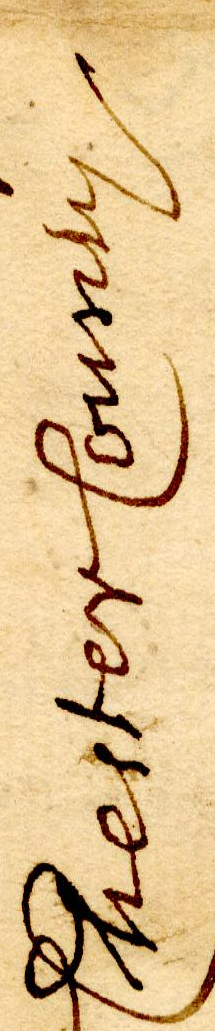Chester County
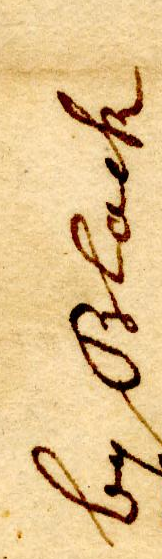by Black
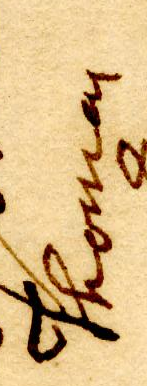Thomas
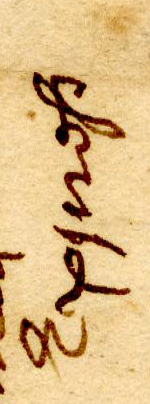Express
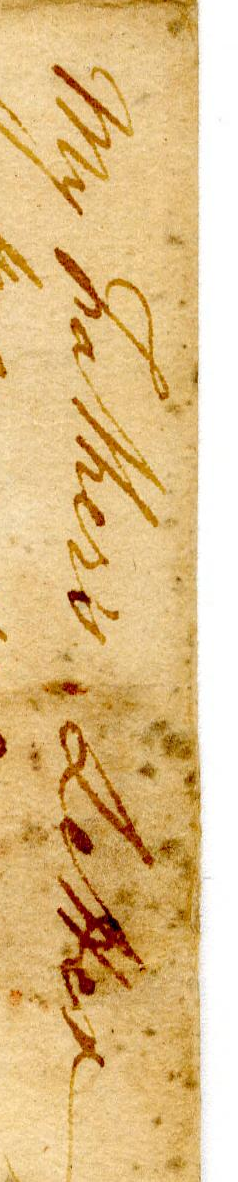My Father's Letter
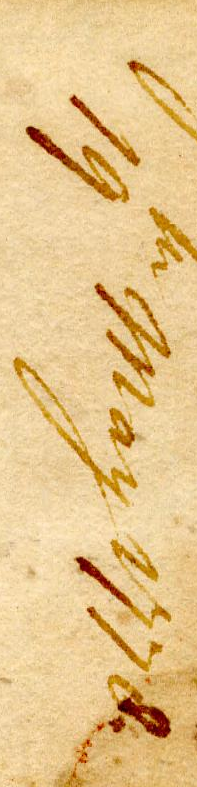19th May 1778
